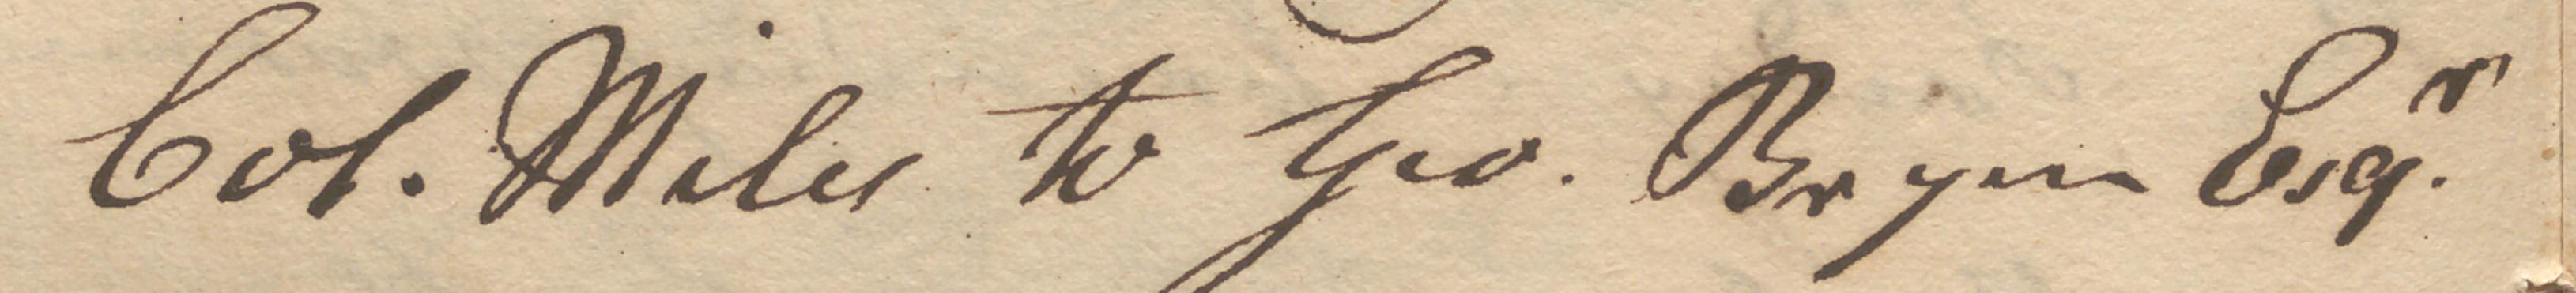Col. Miles to Geo. Bryen Erq^r.
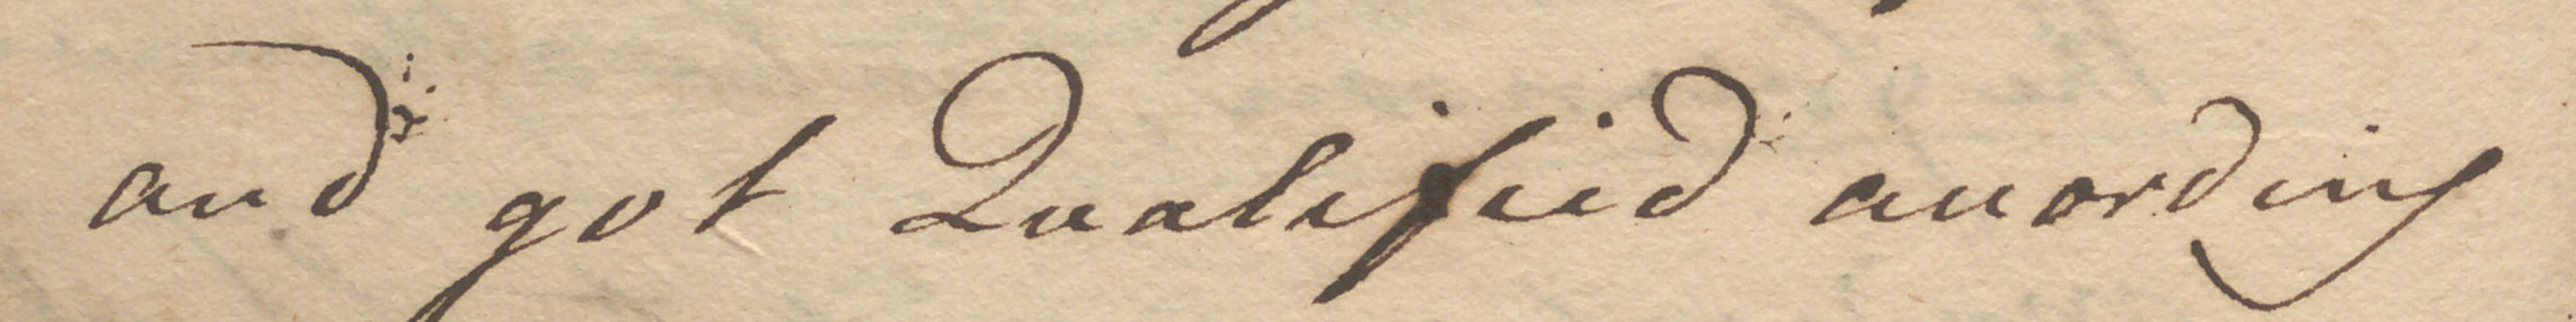and got Qualefied according
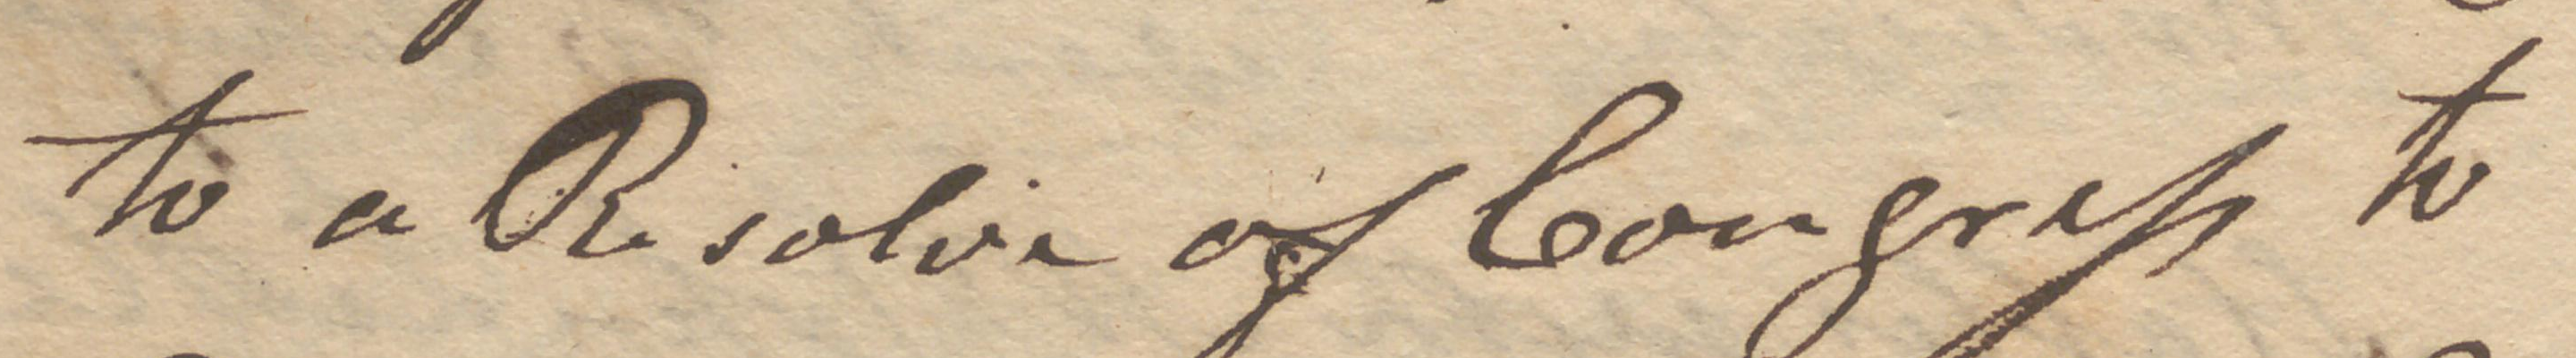to a Resolve of Congress to
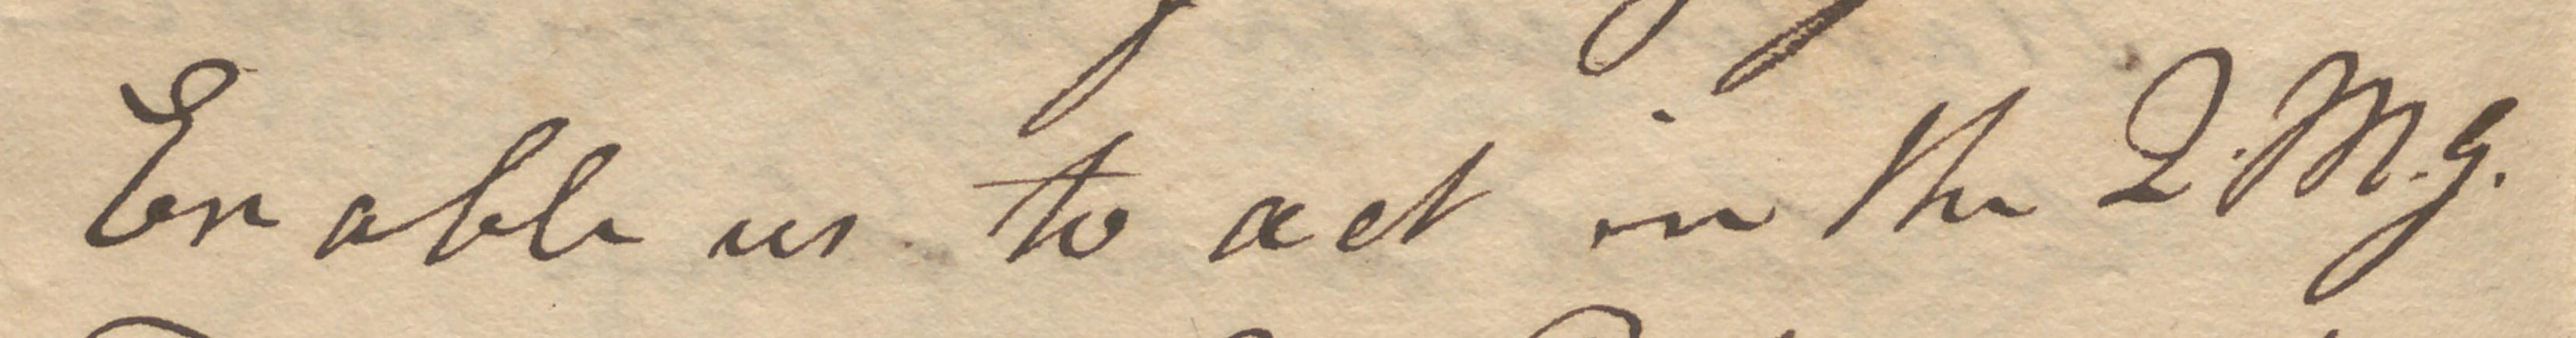Enable us to act in the QMG.
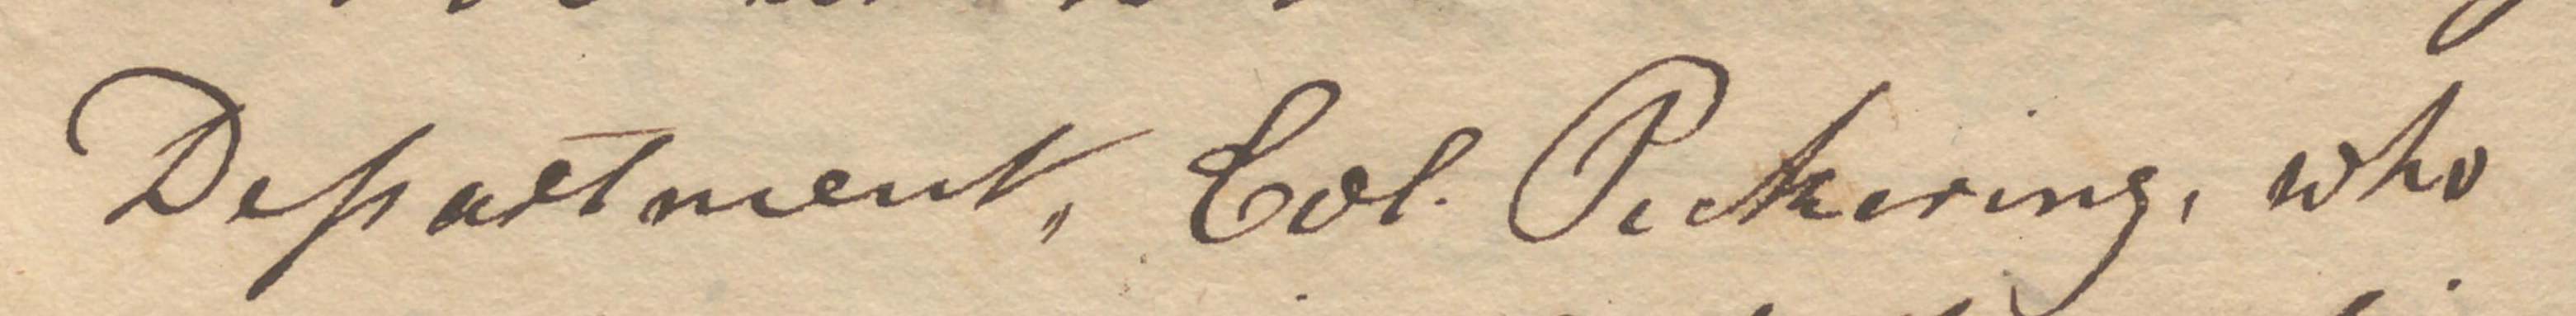Department, Col. Pickering, who
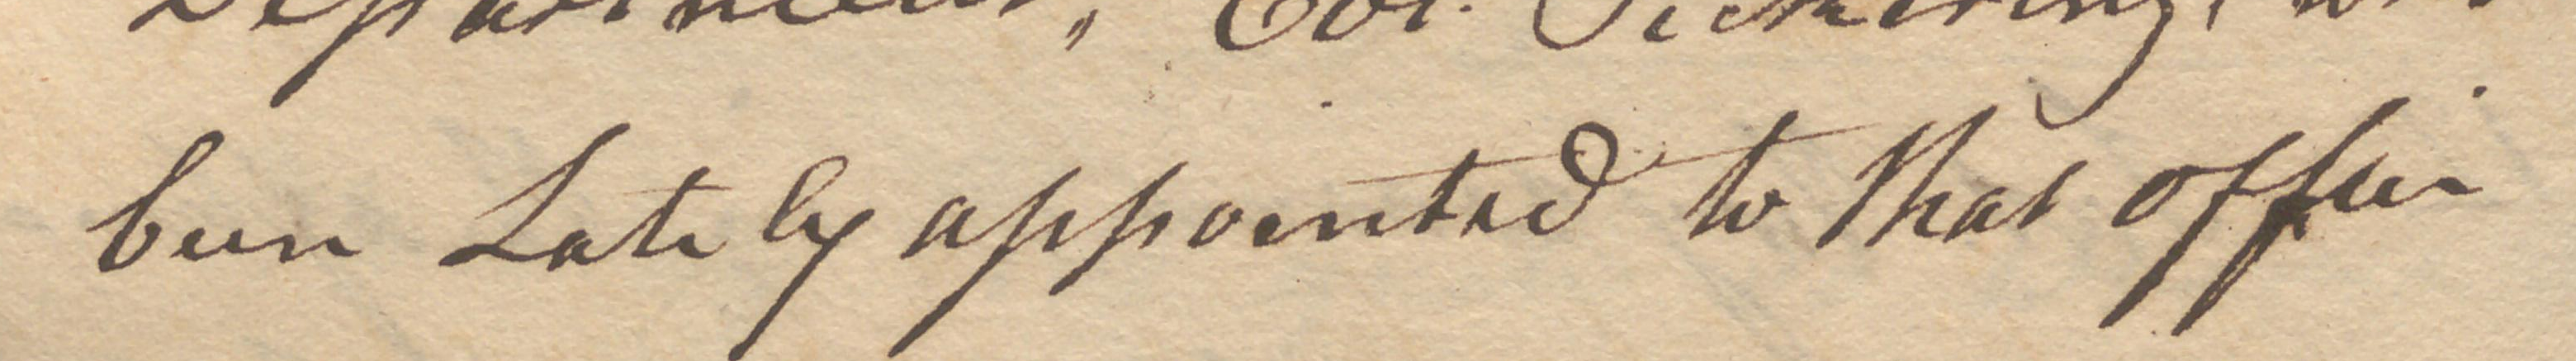been Lately appointed to that office
